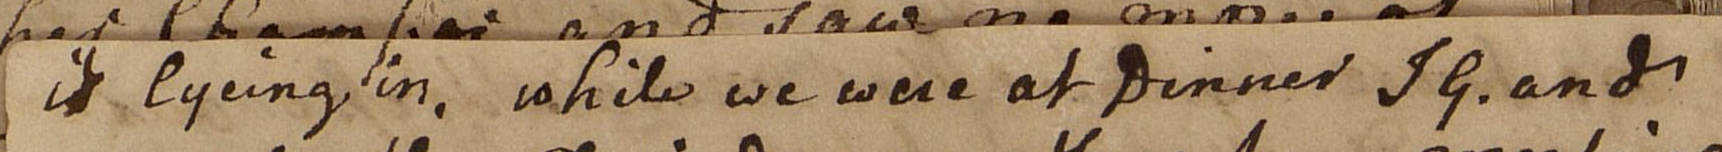it lyeing in, while we were at Dinner S G. and
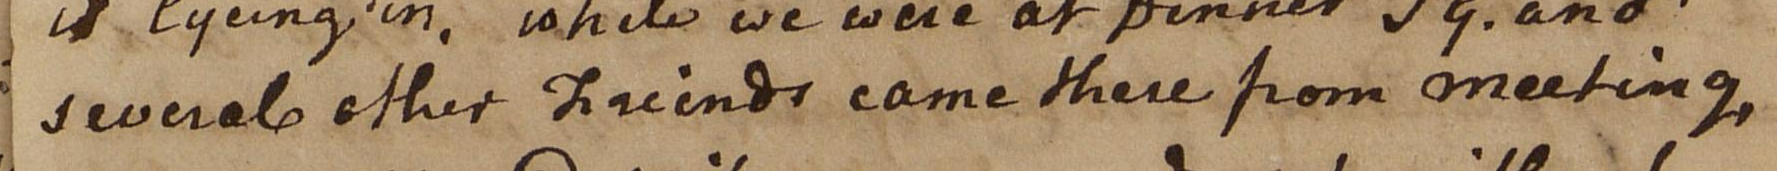several other Friends came there from meeting,
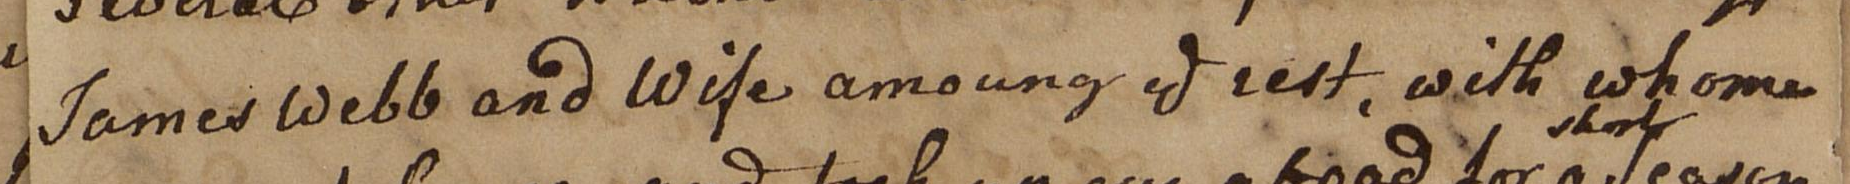James Webb and Wife amoung y^e rest, with whome
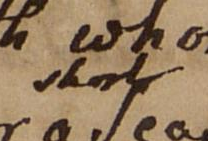short
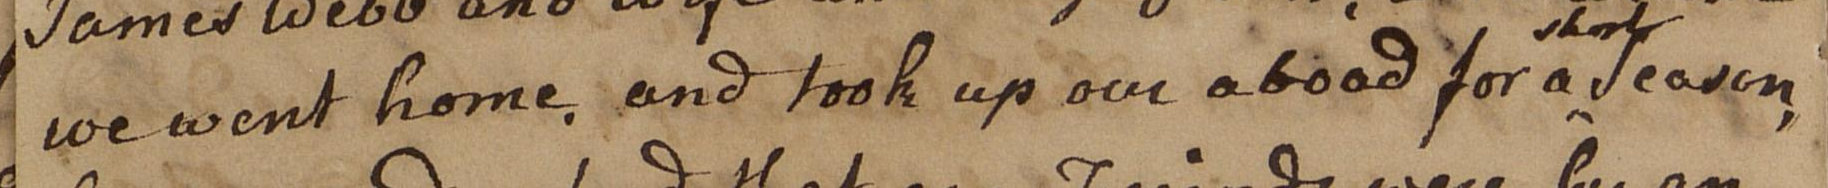we went home, and took up our aboad for a ^ Season
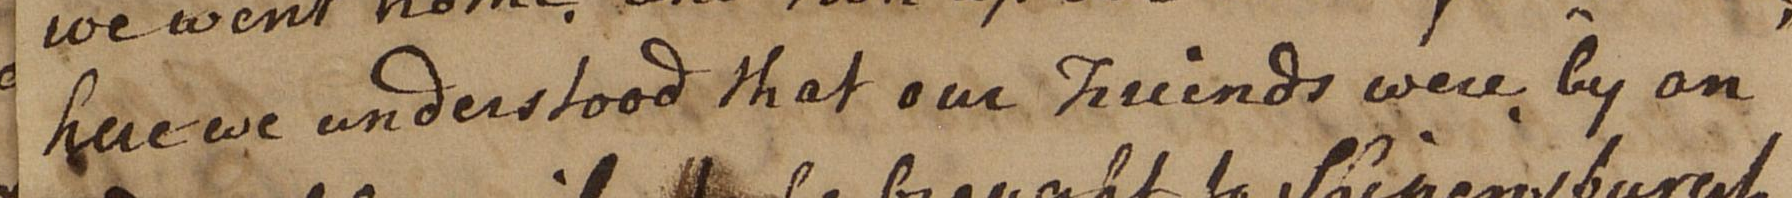here we understood that our Friends were by an
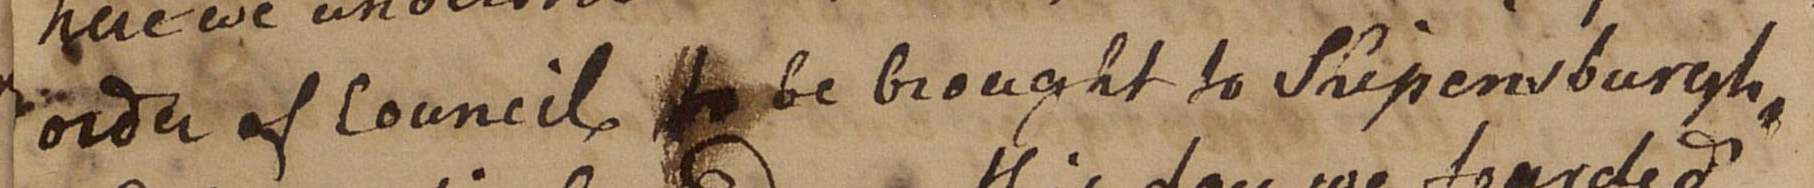order of council to be brought to Shipensburgh,
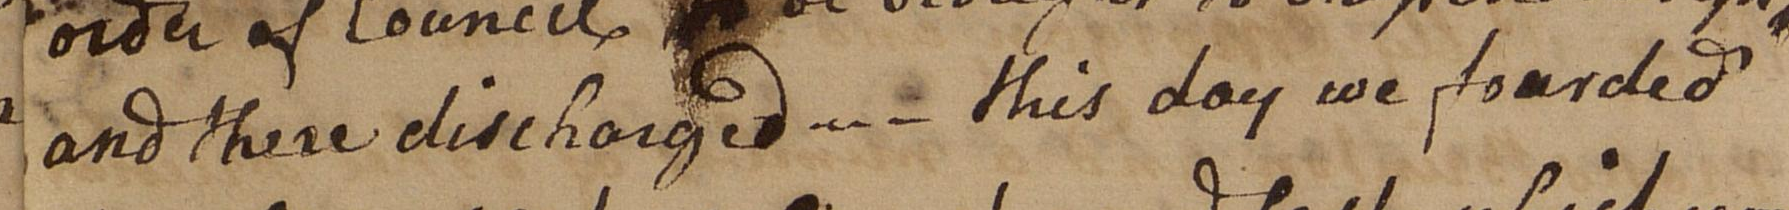and there discharged-- this day we foarded
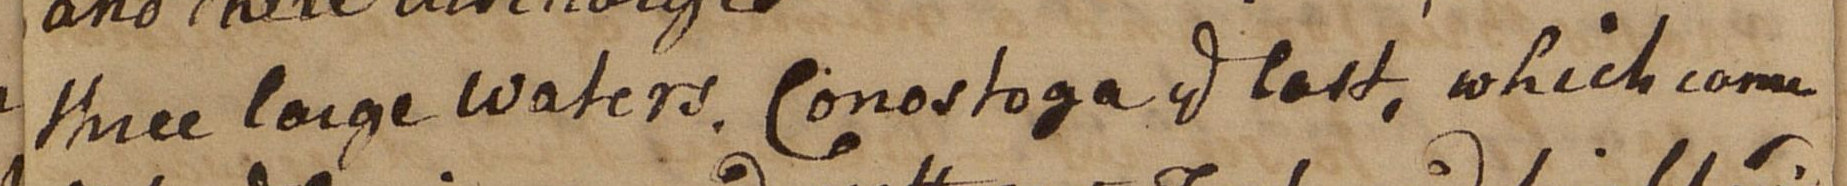three large waters. Conostoga y^e last, which came
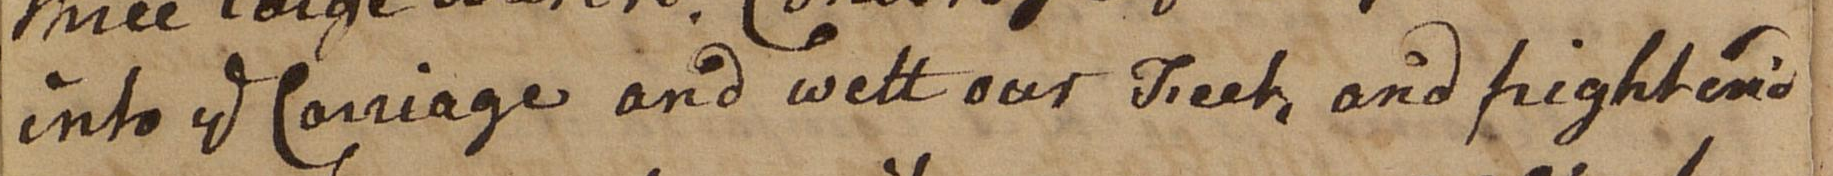into y^e Carriage and wett our Feet and frighten'd
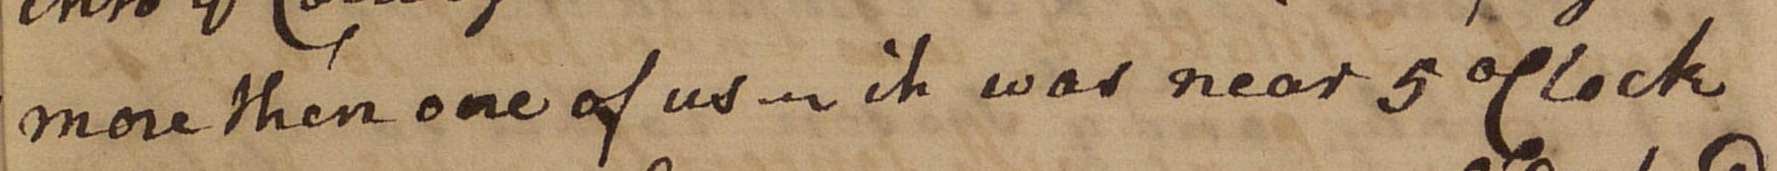more then one of us- it was near 5 ^o Clock
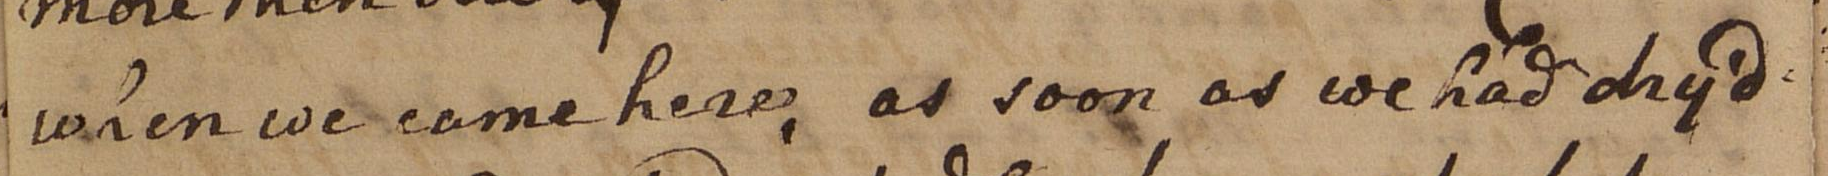when we came here, as soon as we had dry'd
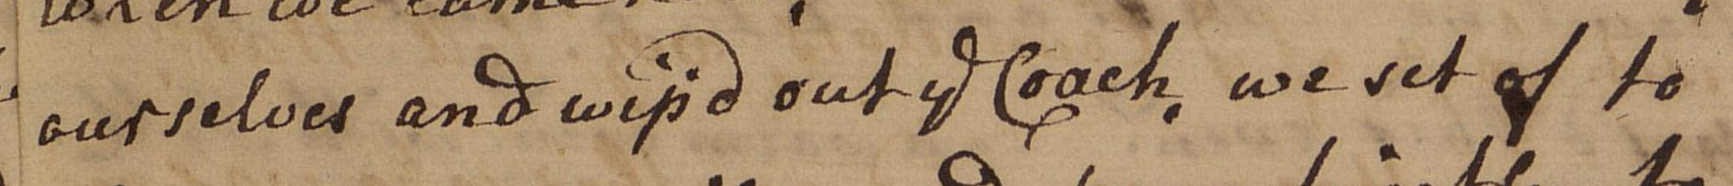ourselves and wip'd out y^e Coach, we set of to
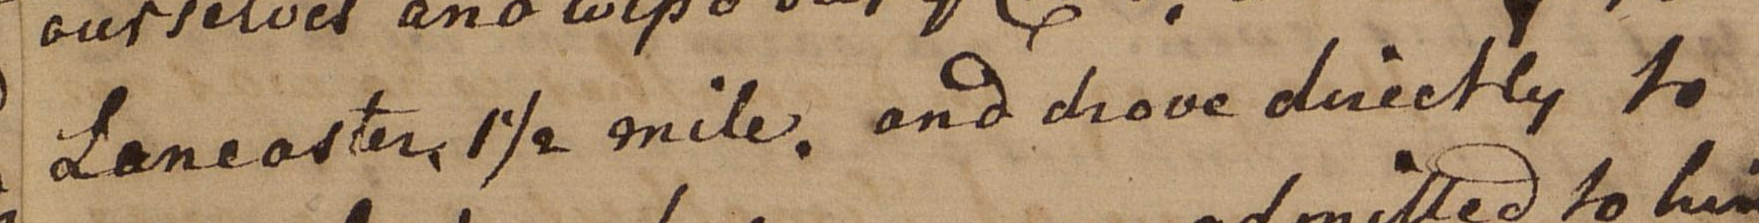Lancaster, 1/2 mile, and drove directly to
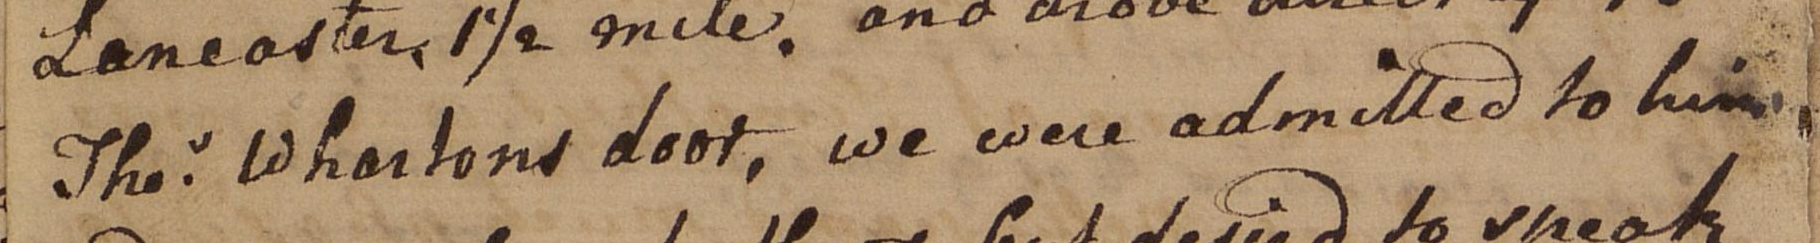Tho^s. Whartons door, we were admitted to him.
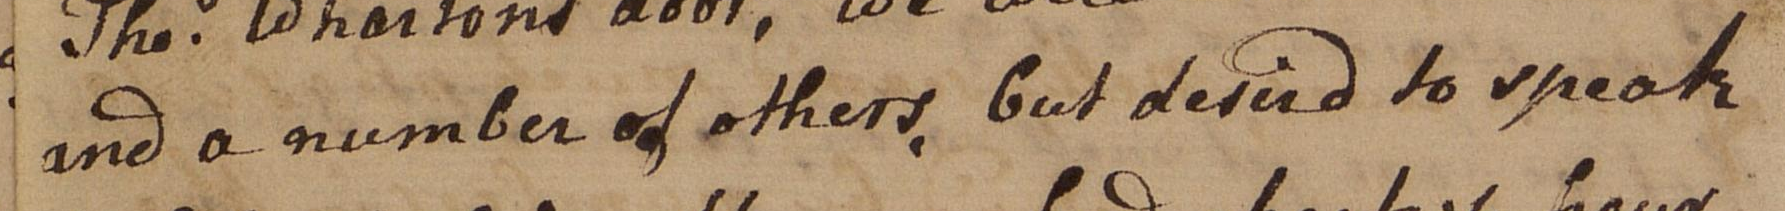and a number of others but desird to speak
